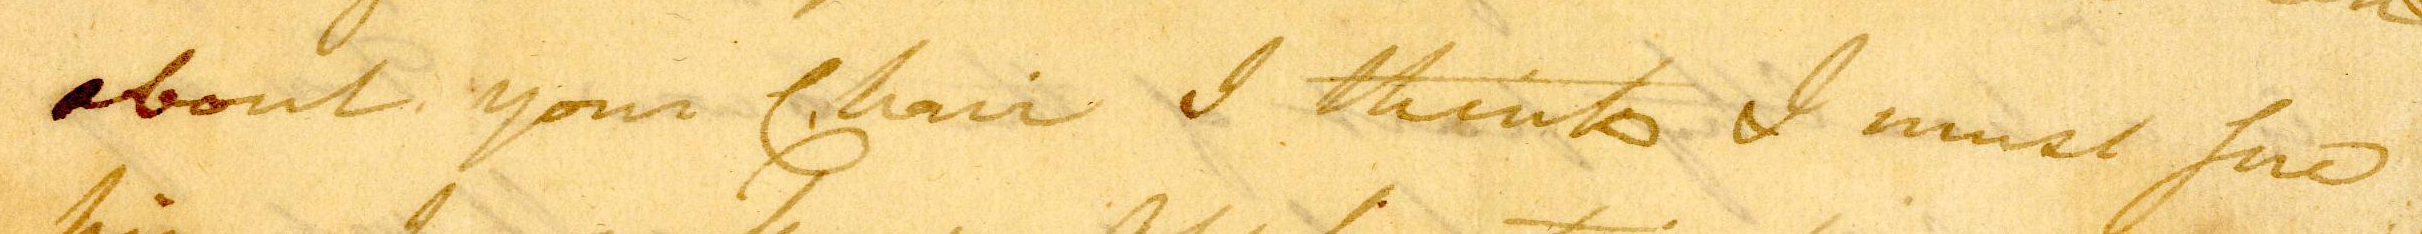about your Chair I think I must sue
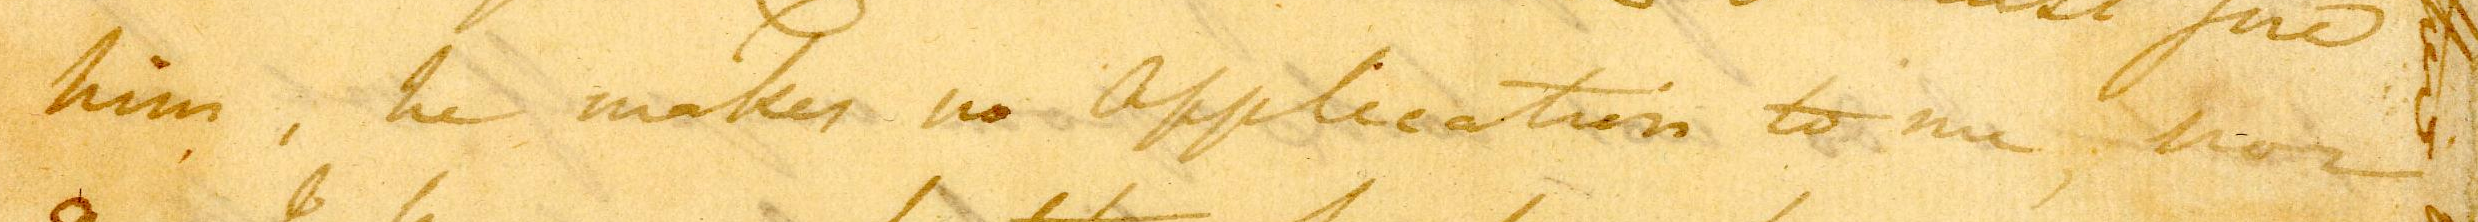him, he makes no Application to me nor
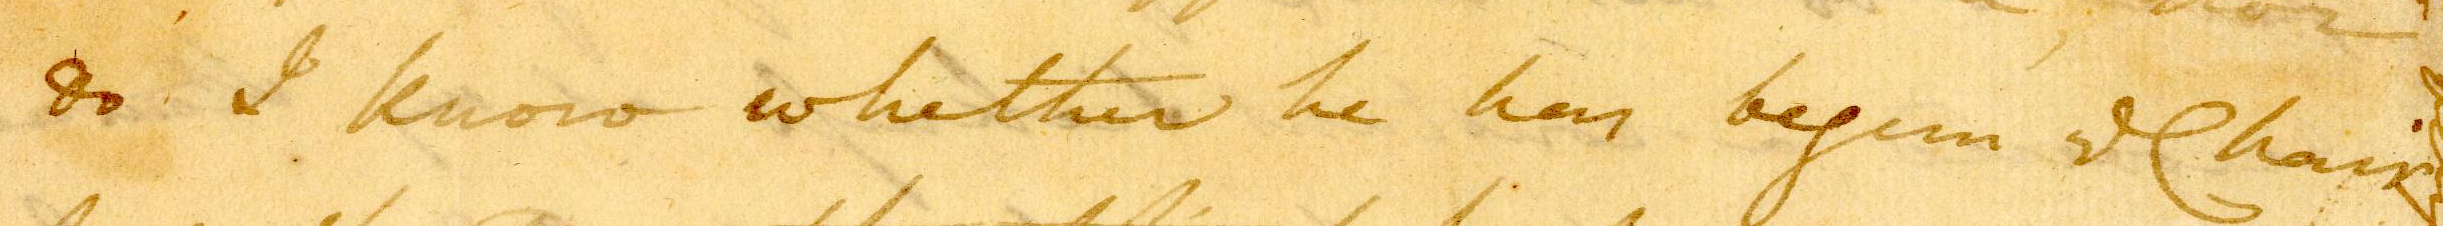do I know whether he has begun y^e Chair
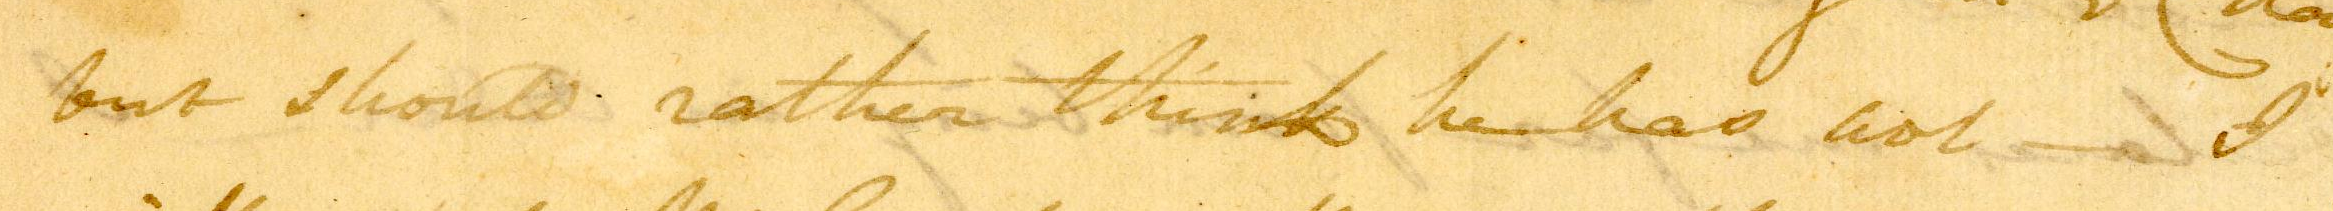but should rather think he has not. I
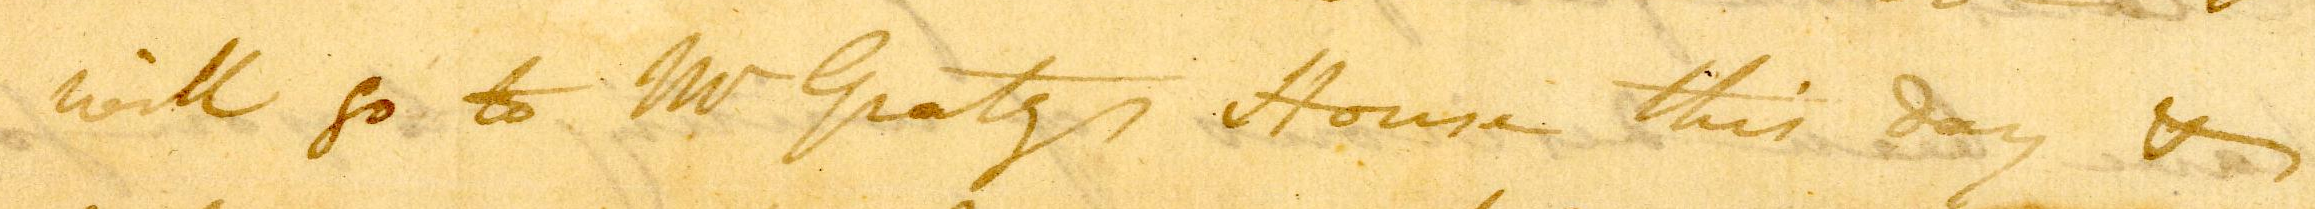will go to M^r Gratz House this day &
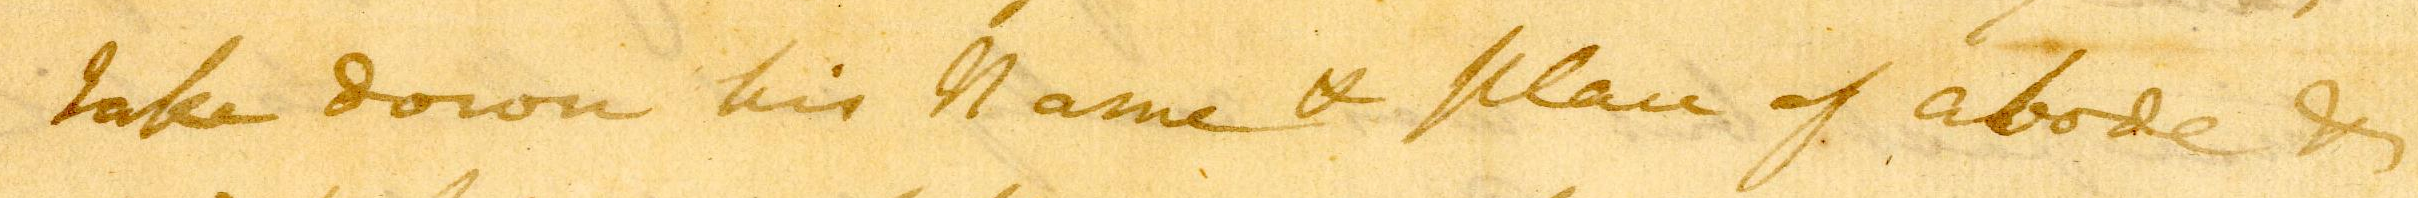take down his Name & place of abode &
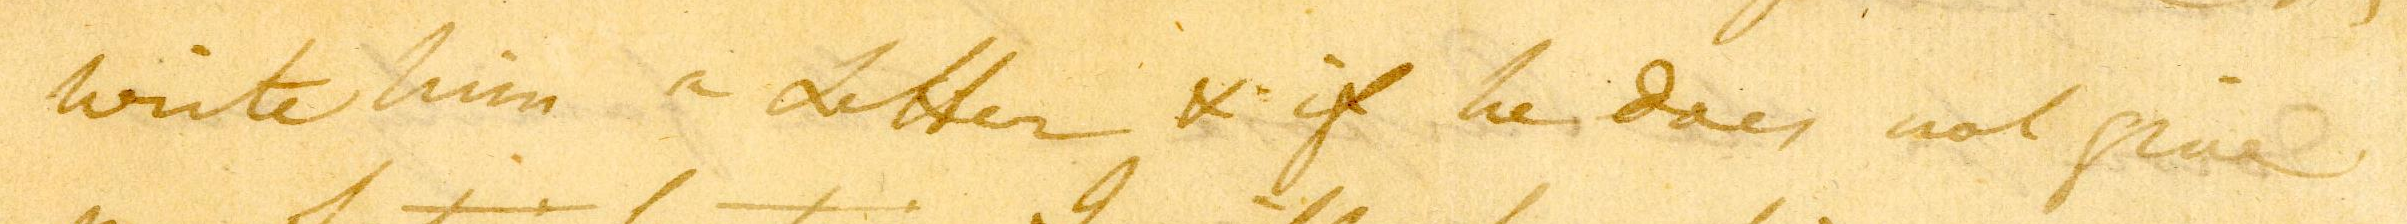write him a Letter & if he does not give
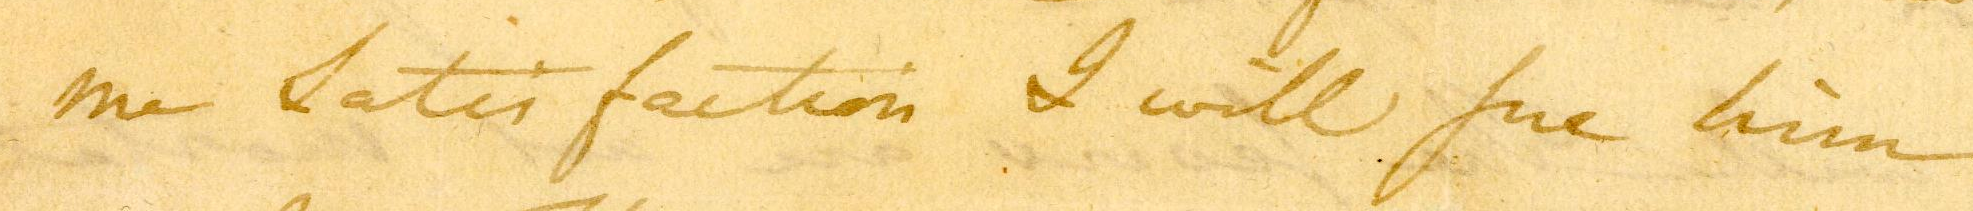me Satisfaction I will sue him
